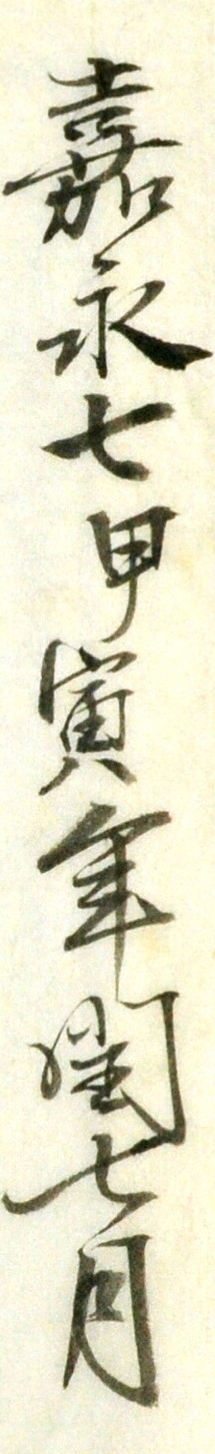嘉永七甲寅年閏七月
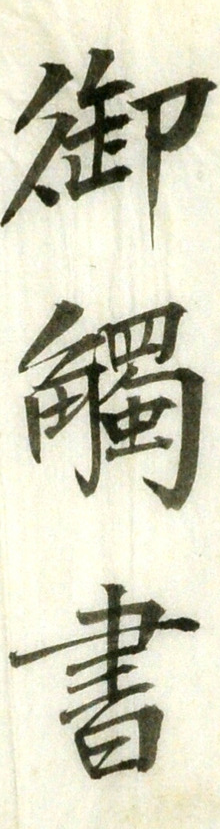御触書

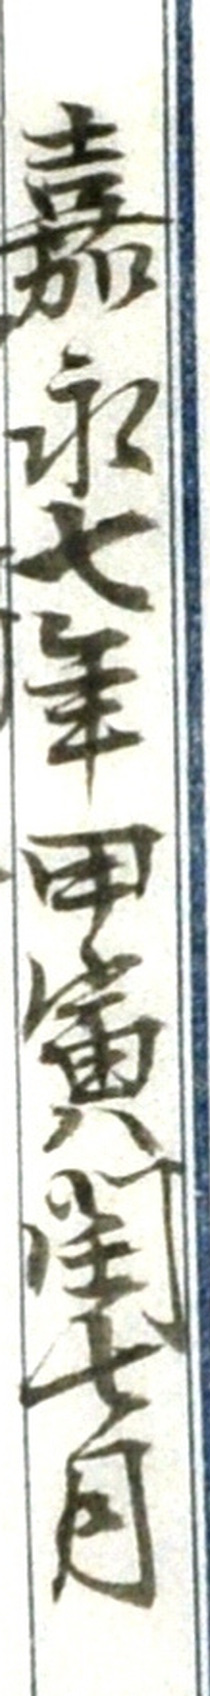嘉永七年甲寅閏七月
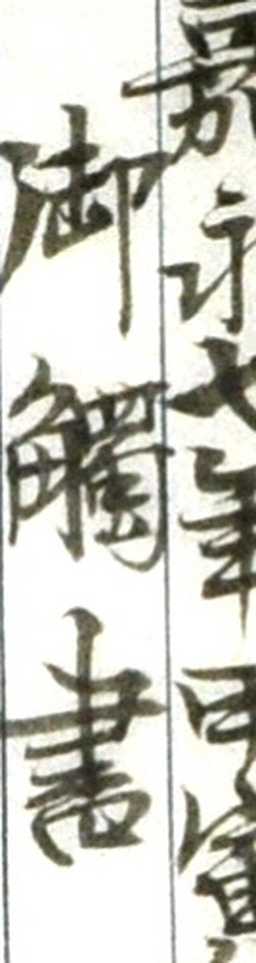御触書
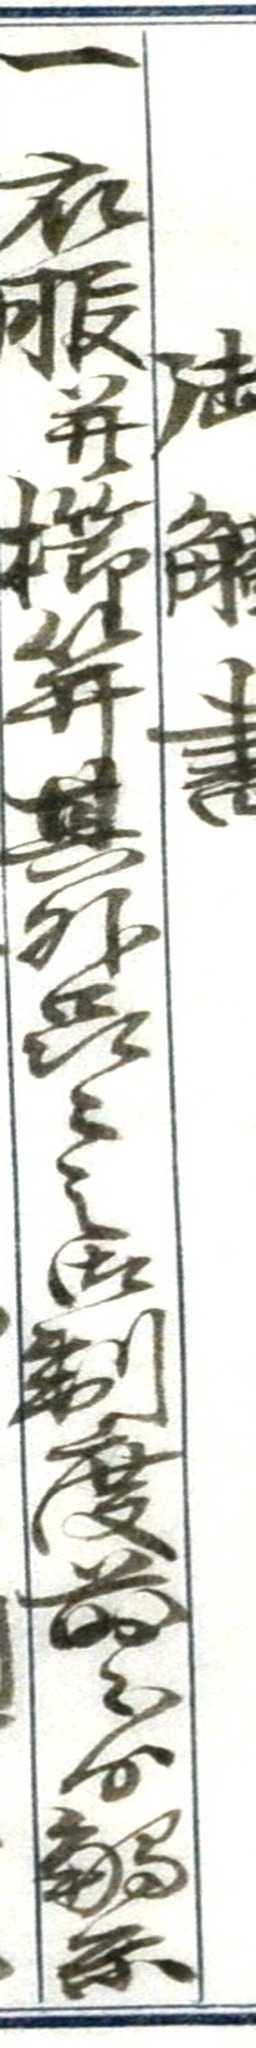一衣服并櫛笄其外品々之御制度前々ゟ触示
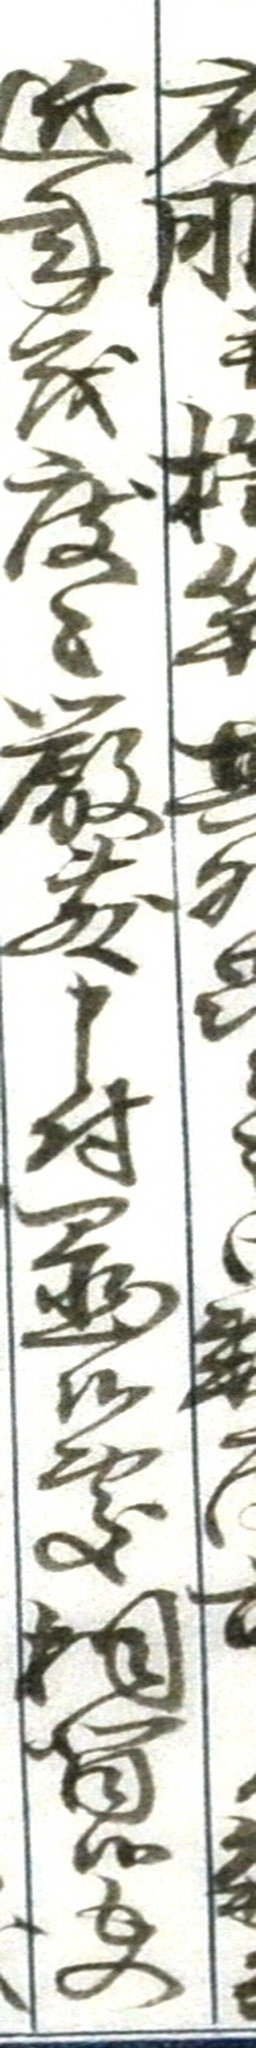近年茂度々厳敷申付置候処相背候もの
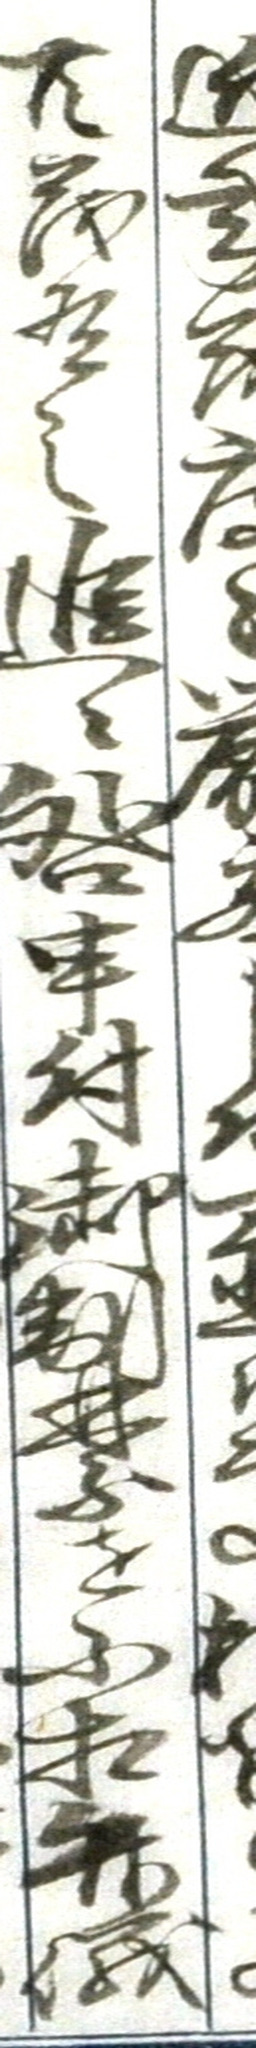共茂有之追々咎申付御制禁を不相弁儀
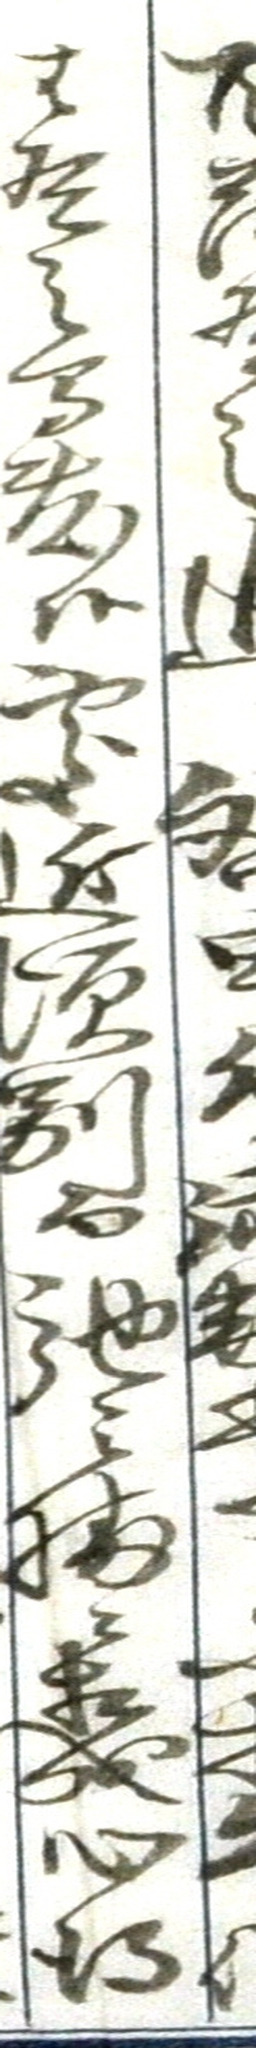は有之間敷候処近頃別而弛み勝に相成心得
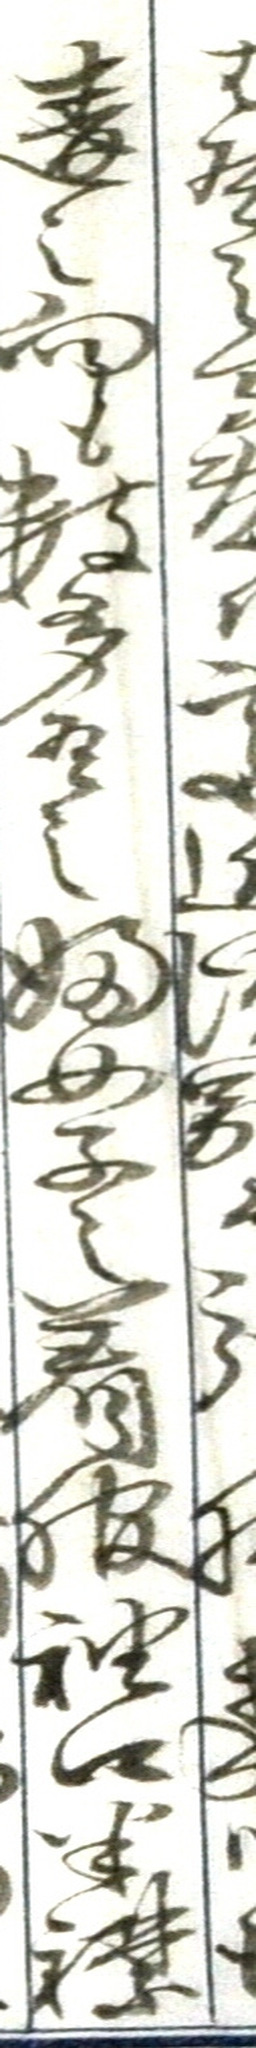違之向も数多有之婦女子之着服袖口半襟
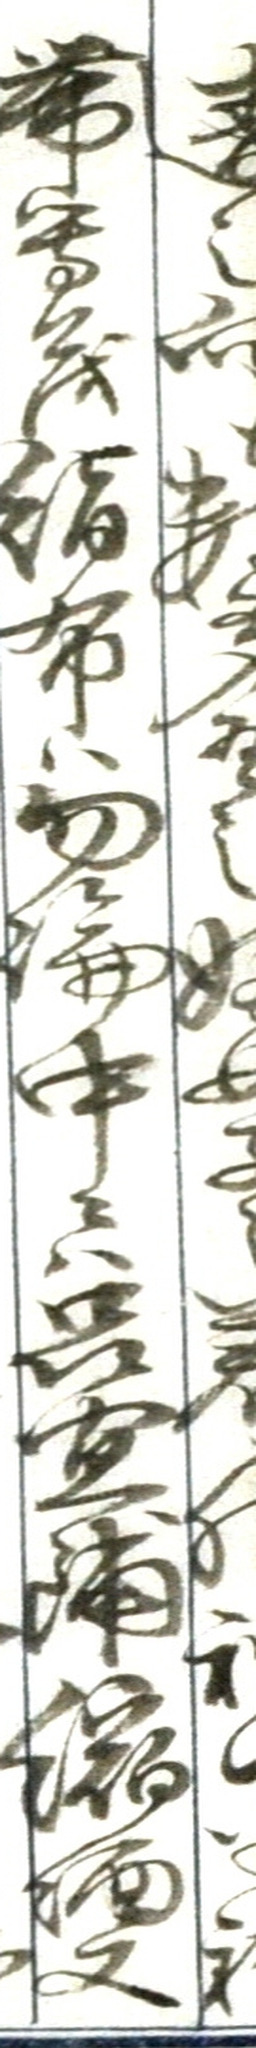帯等茂絹布は勿論中ニは品宜敷縮緬又
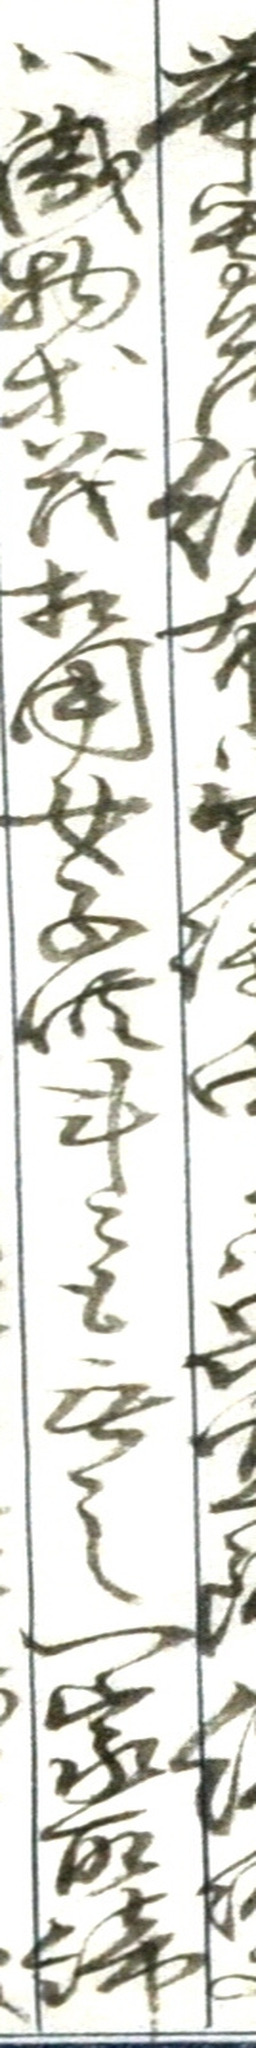は織物等茂相用女子供斗ニも無之一家取締
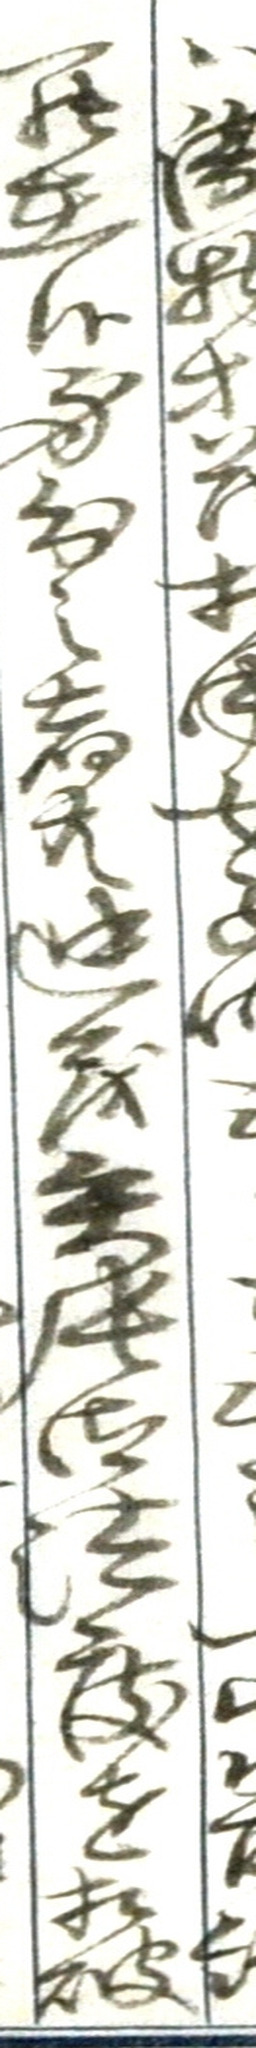罷在候身分之者共迚茂矢張御法度を相破
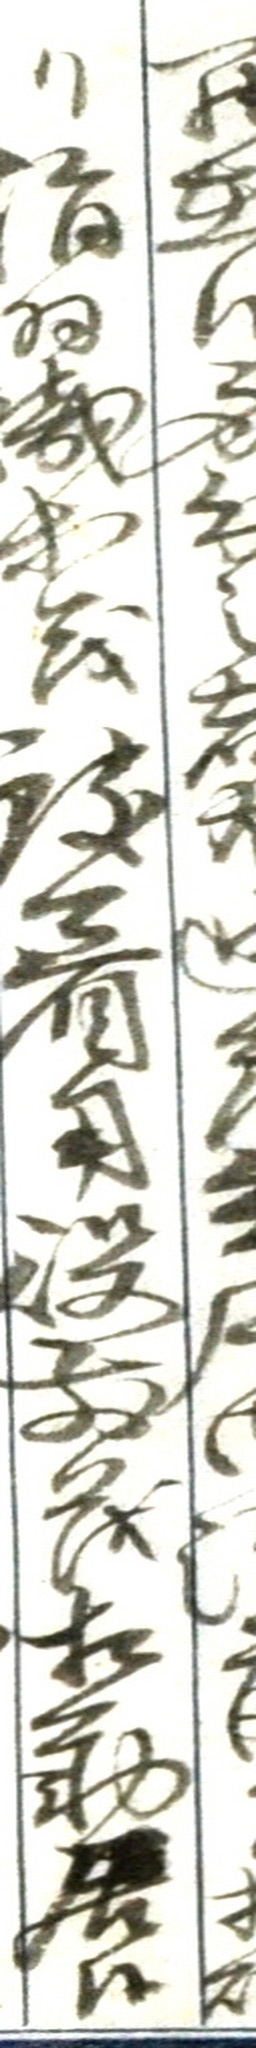り絹羽織等茂致着用役前茂相勤居候
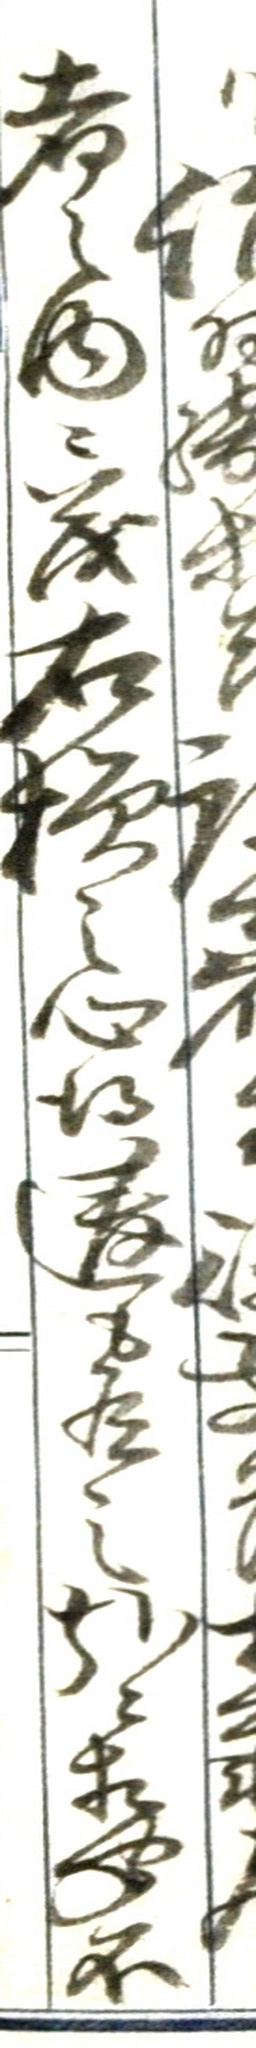者之内ニ茂右様之心得違も有之哉に相聞不

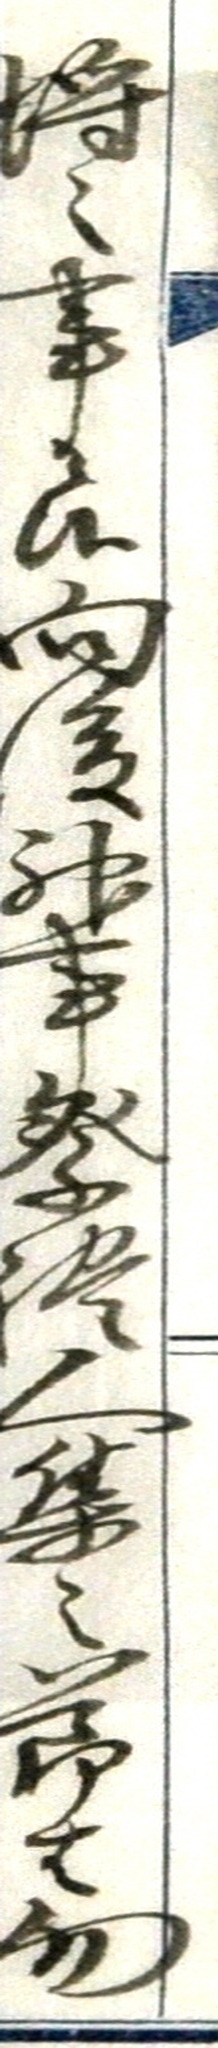埒之事ニ候向後神事祭礼人集之節は勿
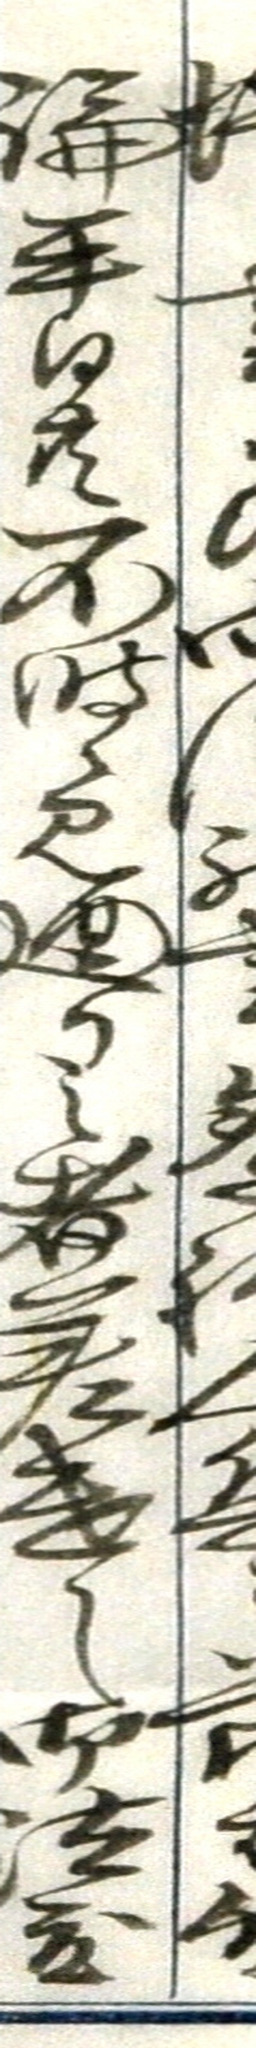論平日共不時之見廻り之者差遣し御法度
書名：御触書
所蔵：伊那市立高遠町図書館・合同会社AMANE
